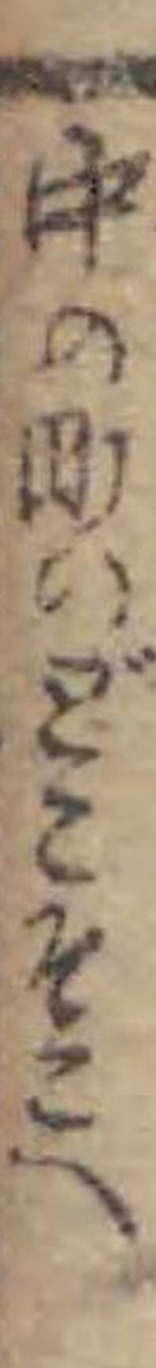中の町のどこそこへ
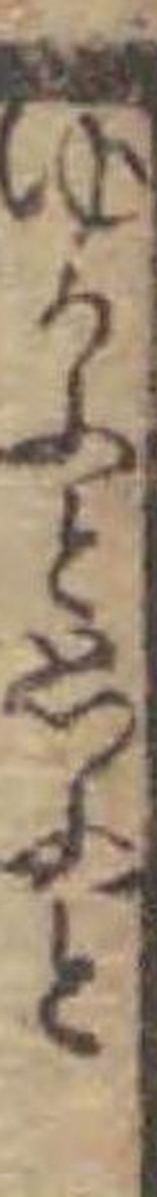ゆかふと思ふと
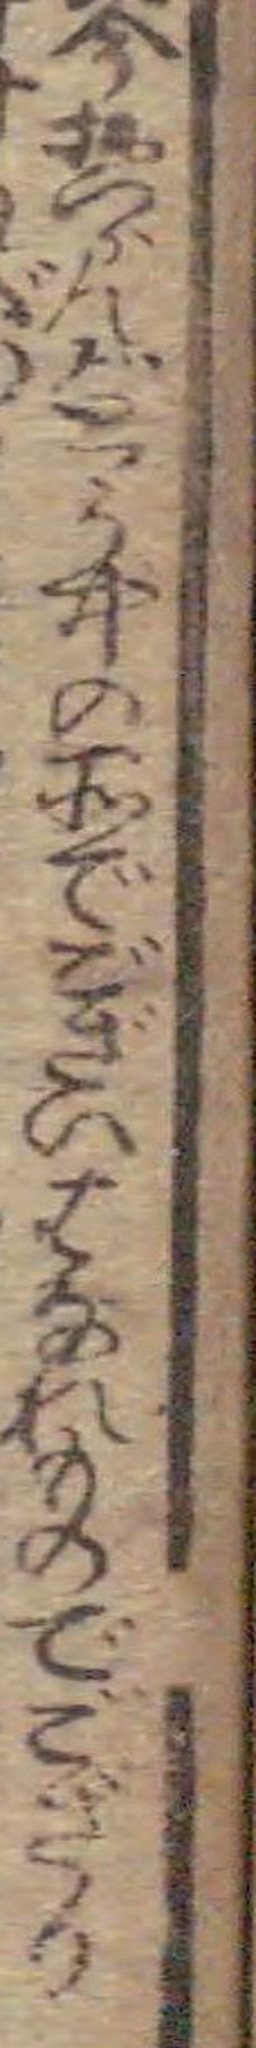〽只今おいらんふぁどう中の所でございはなれものでござり
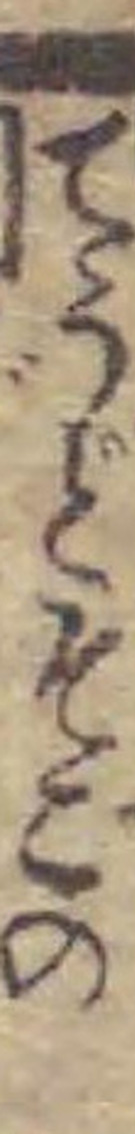てうどそこの
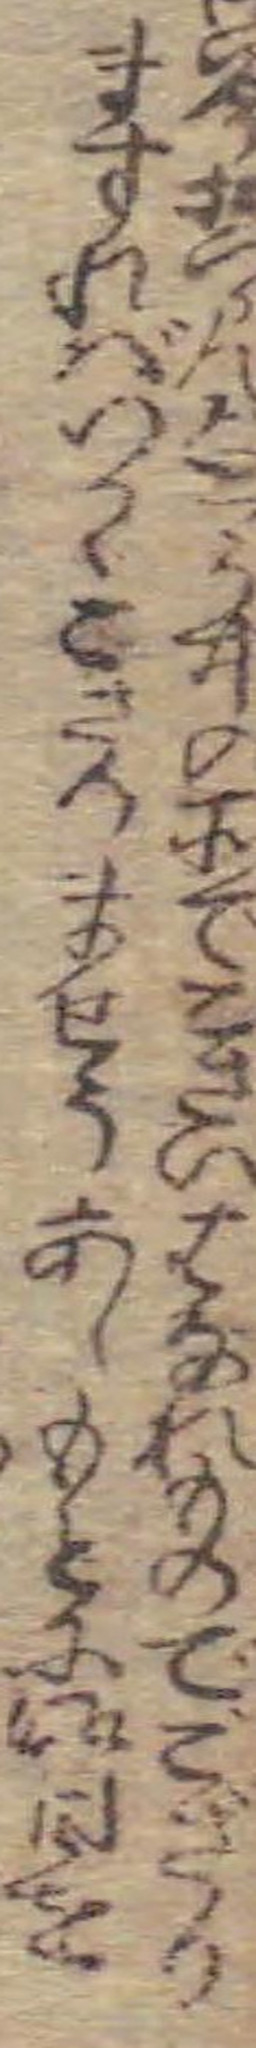ますればいかゝこさりませうあしもとに御目を
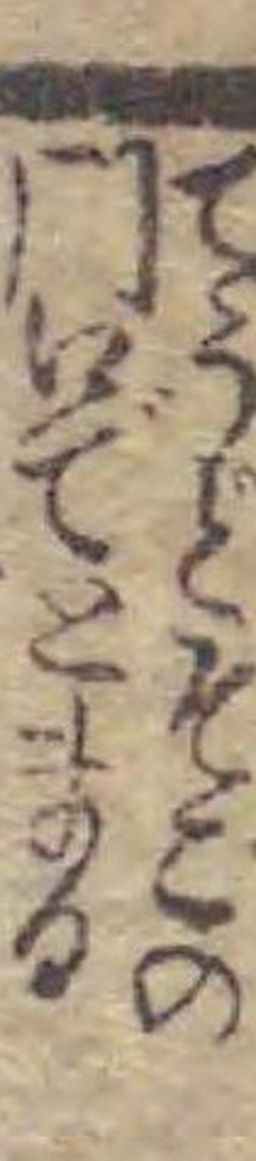門口でとまる
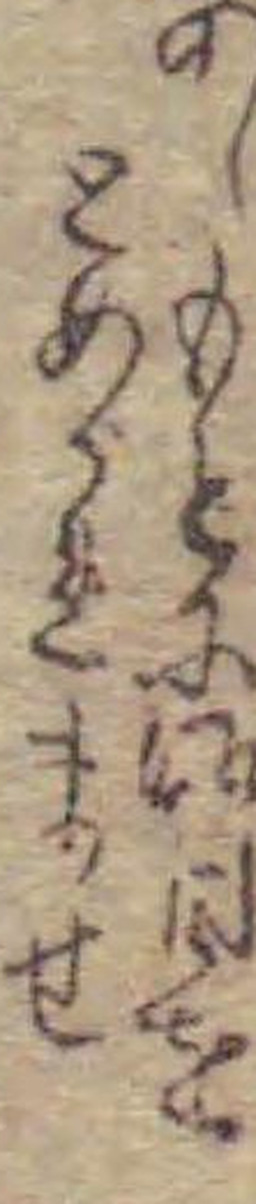とめられませ
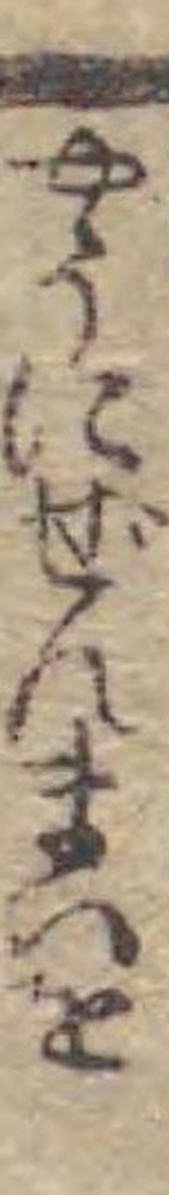やうにぜんまいを
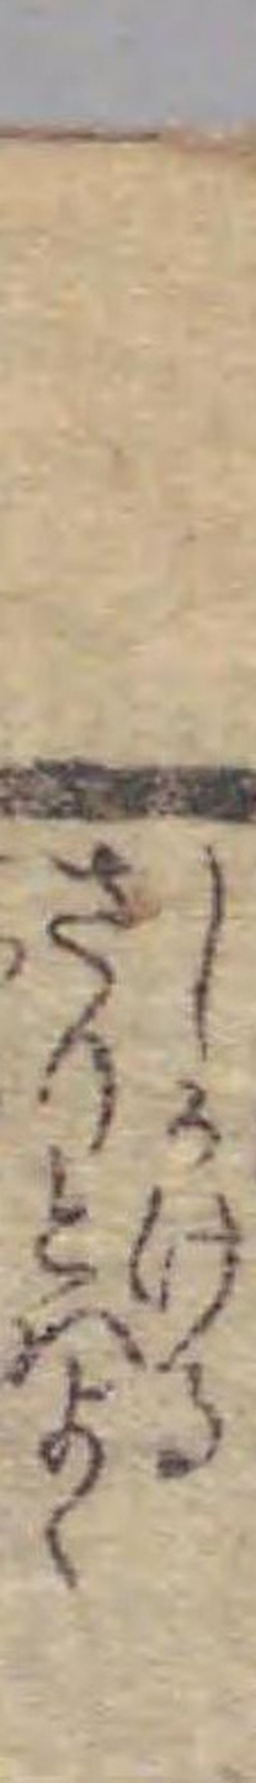さりとはよく
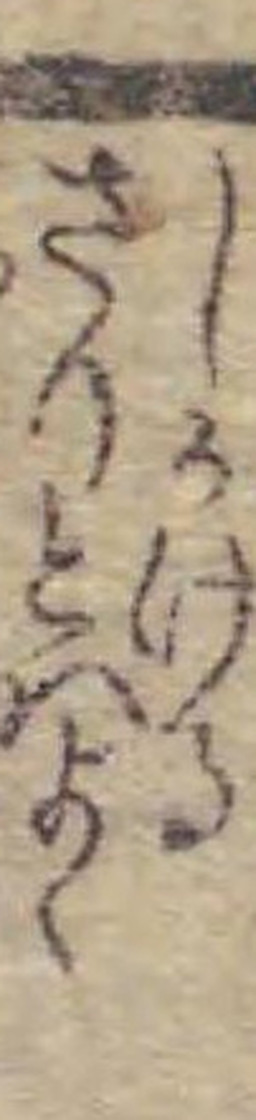さりとはよく
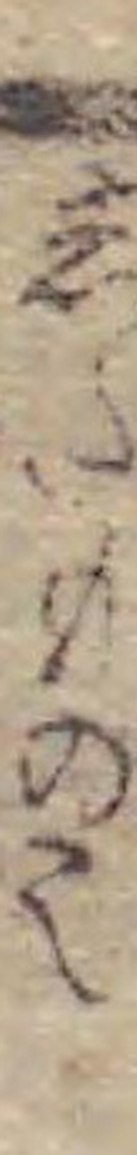したもの也
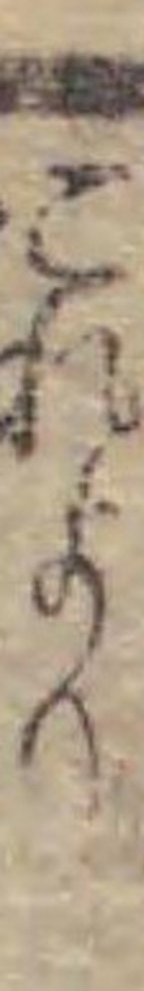これより
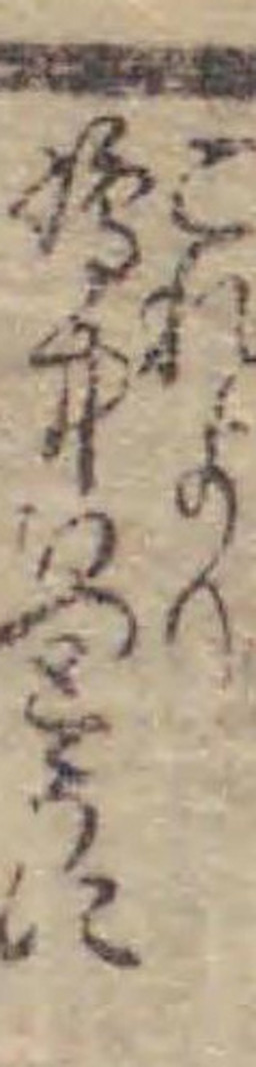島中いつとうに
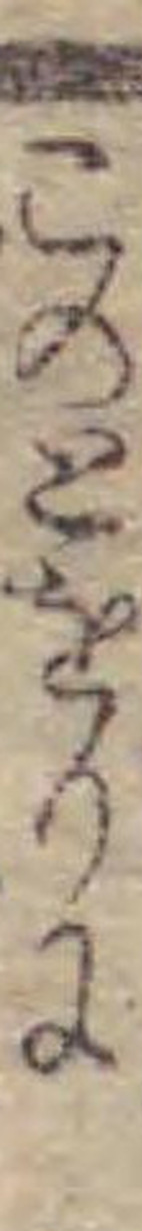このとをりに
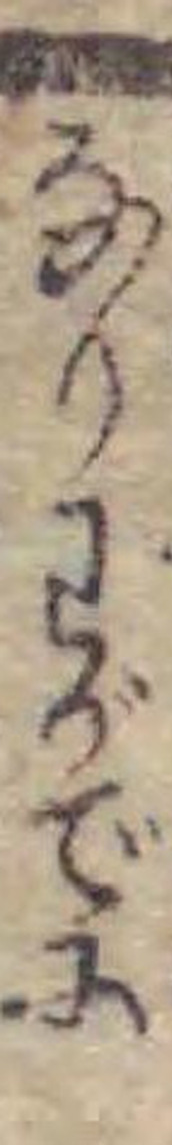なりわがでに
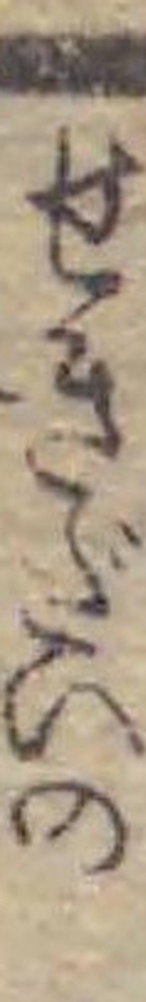せきだいの
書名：奇妙頂礼胎錫杖 : 3巻
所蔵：国立国会図書館 National Diet Library, JAPAN
